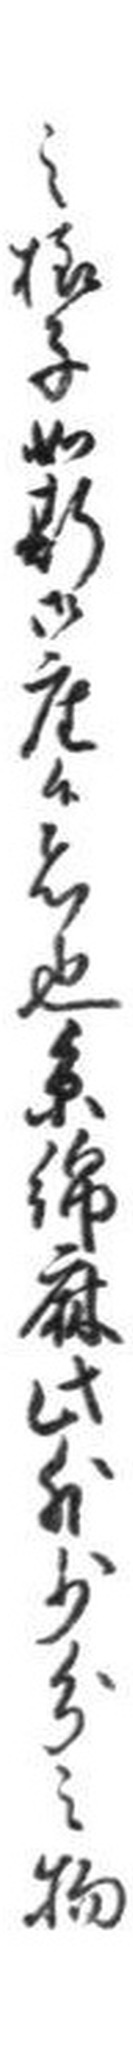之様子如斯御座候者也糸綿麻此外少分之物
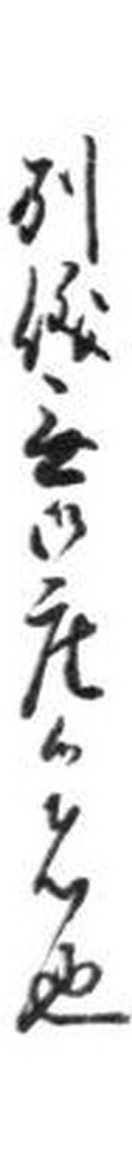別儀無御座候者也
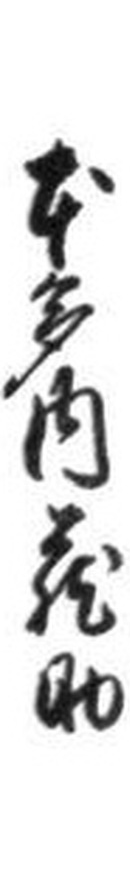本多内蔵助
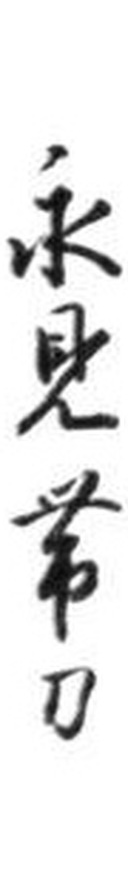永見帯刀
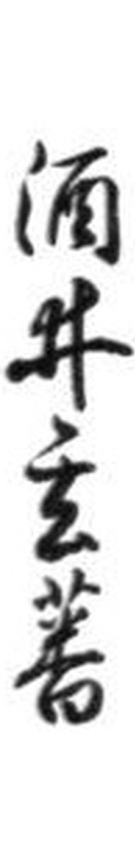酒井玄蕃
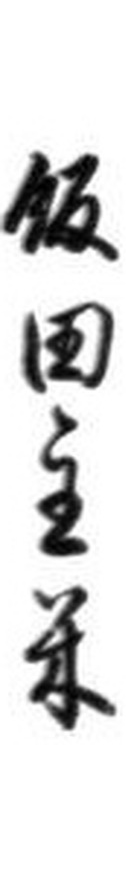飯田主米
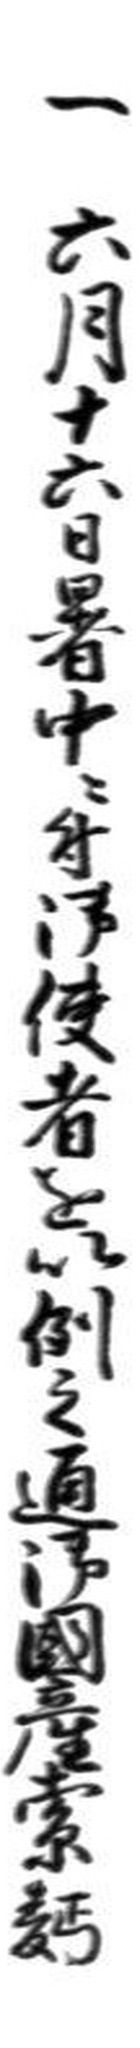一六月十六日暑中ニ付御使者を以例之通御国産索麪
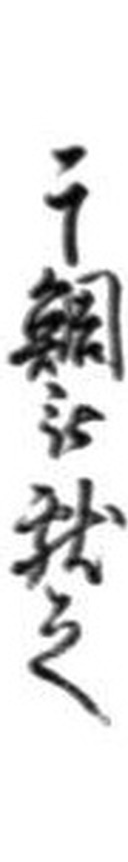干鯛被献之
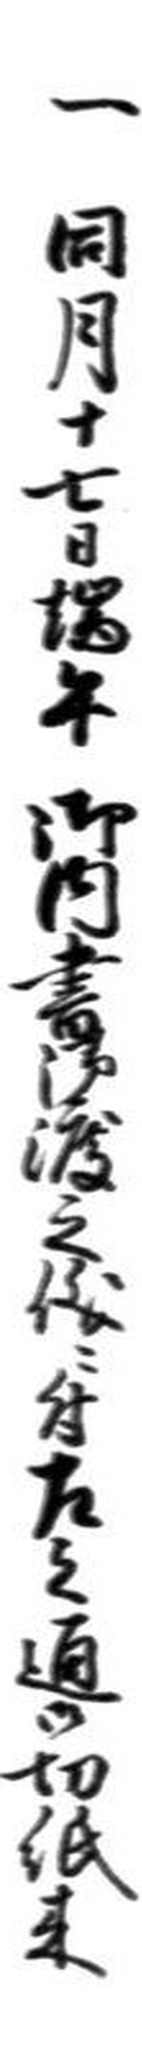一同月十七日端午御内書御渡之儀ニ付左之通御切紙来
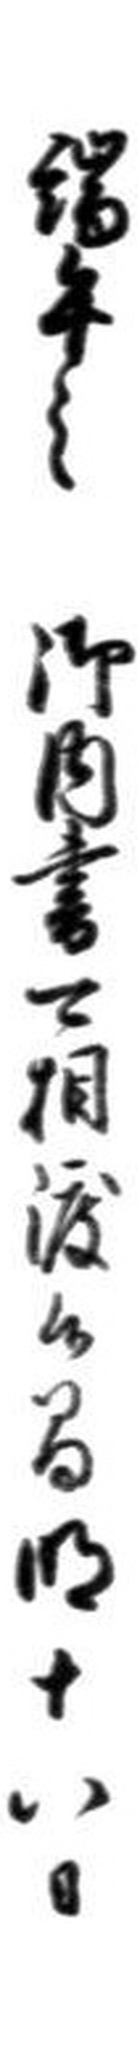端午之御内書可相渡候間明十八日
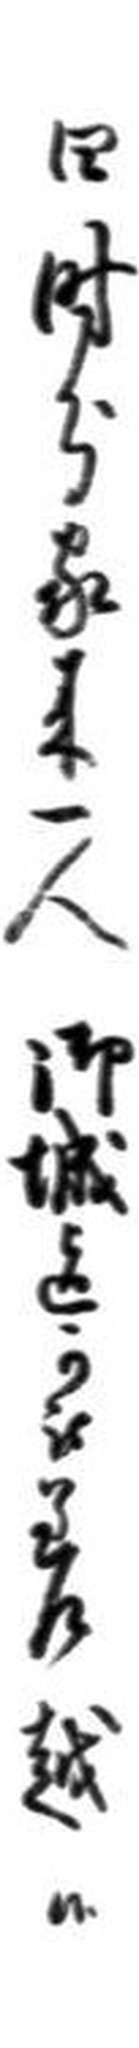四時分家来一人御城迄可被差越候

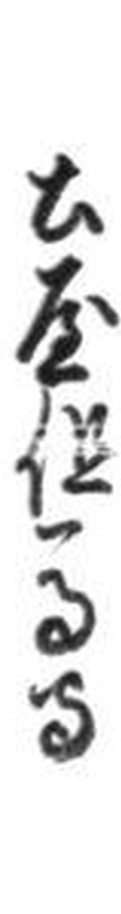土屋但馬守
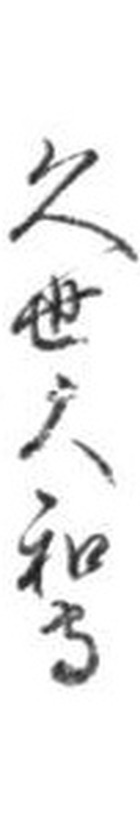久世大和守
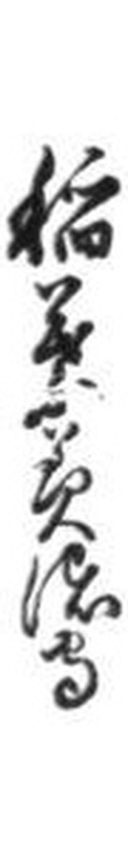稲葉美濃守
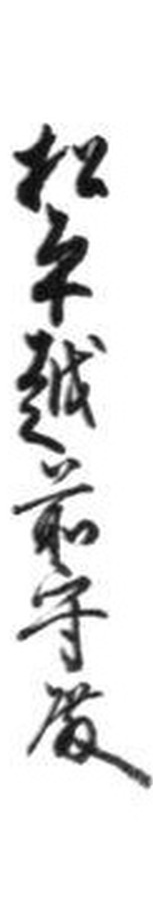松平越前守殿
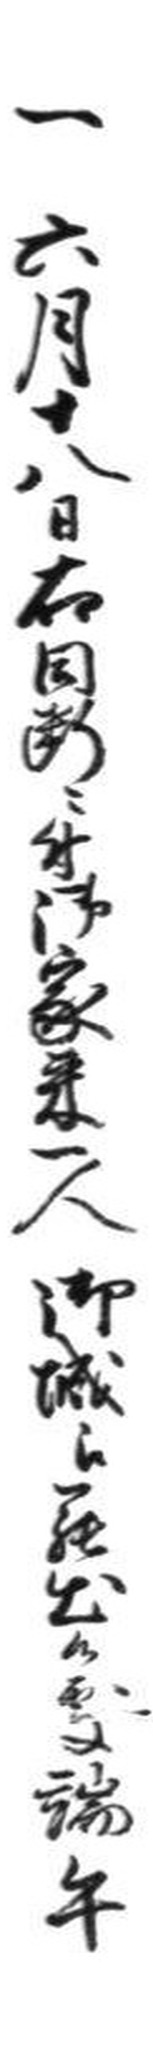一六月十八日右同断ニ付御家来一人御城江罷出候処端午
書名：家譜 七 光通公 従寛文四年到同九年
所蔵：福井県文書館 Fukui Prefectural Archives
